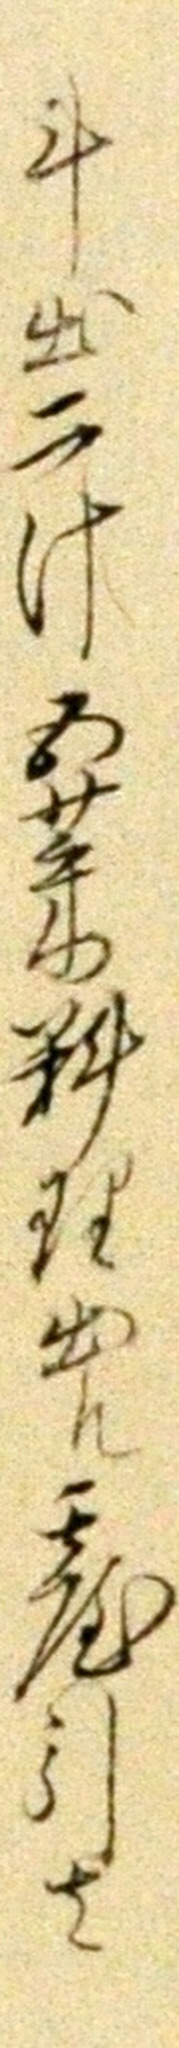斗出二汁五菜料理出ル台引は
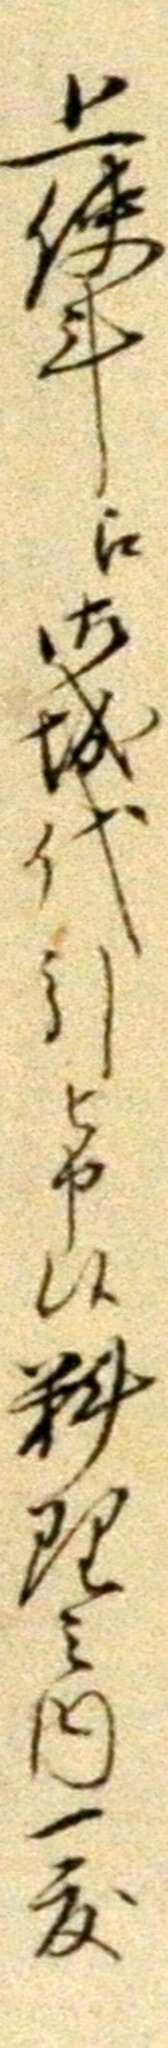上使計え御城代引被申候料理之内一度
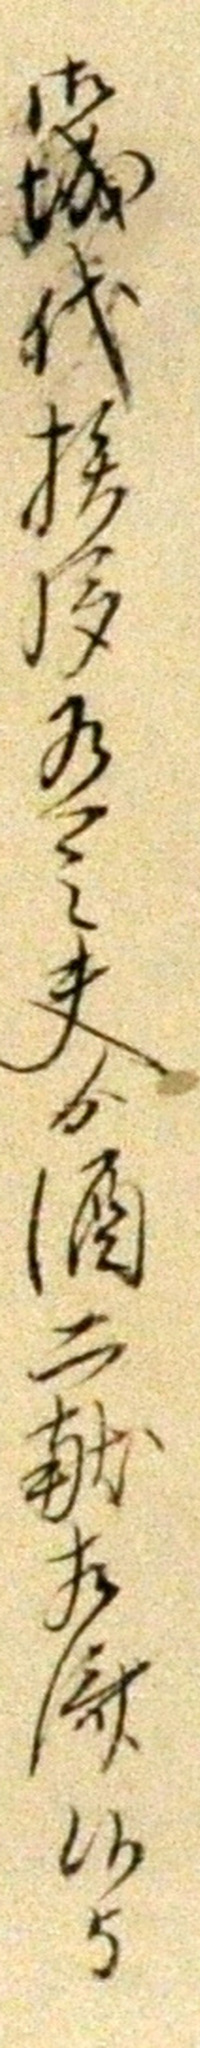御城代挨拶有之夫ゟ酒二献相済候と
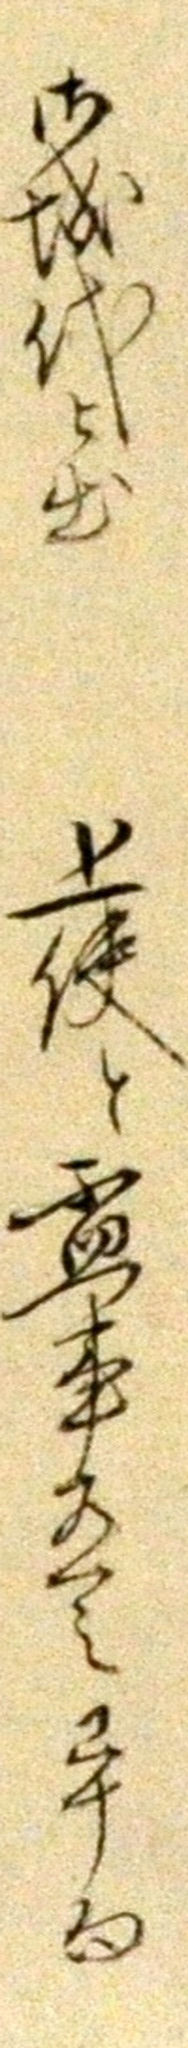御城代被出上使と盃事有之卆而
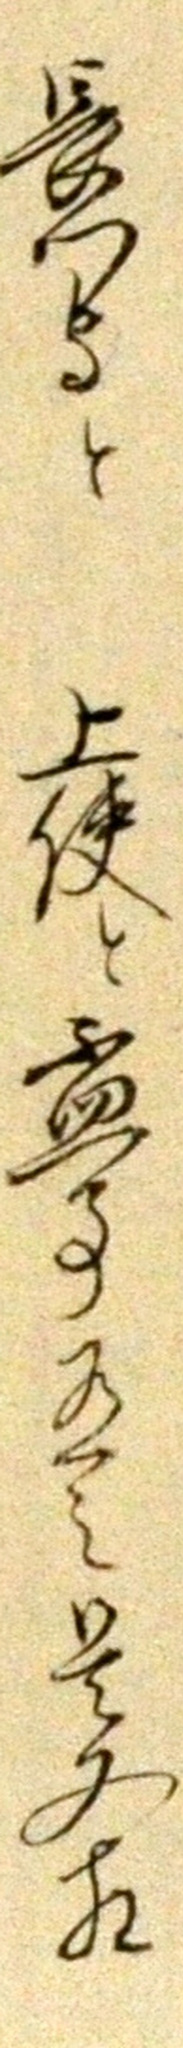長門守と上使と盃事有之是又相
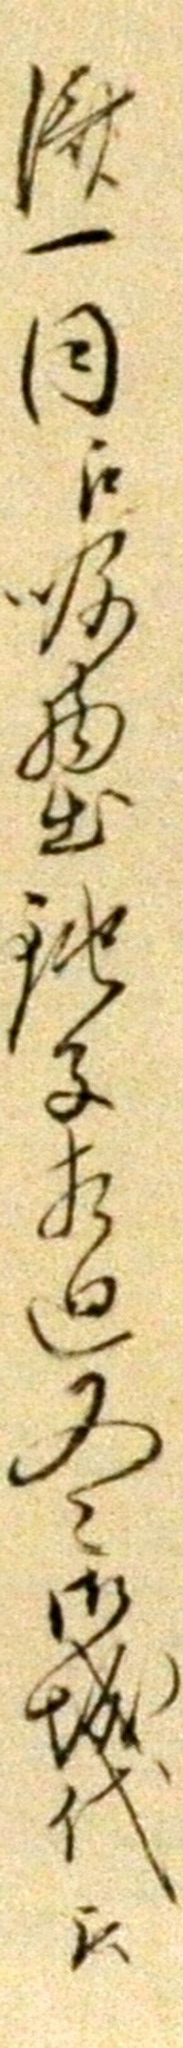済一同え吸物出銚子相廻又々御城代被
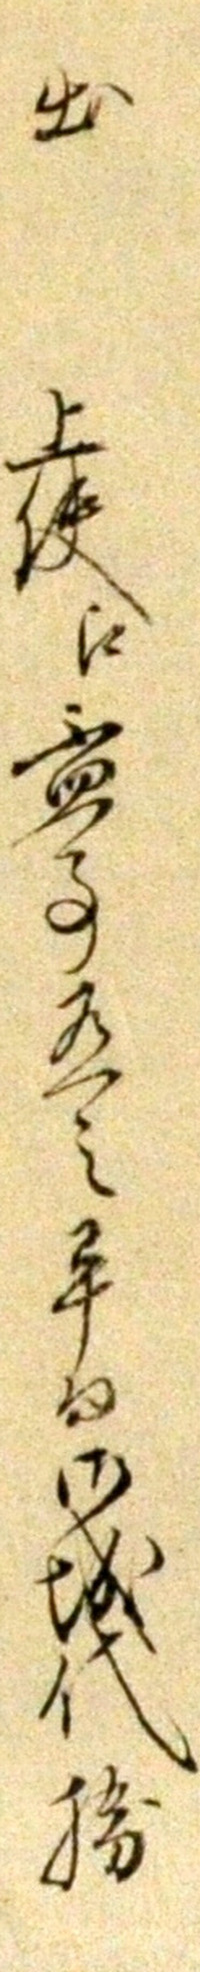出上使え盃事有之卆而御城代勝
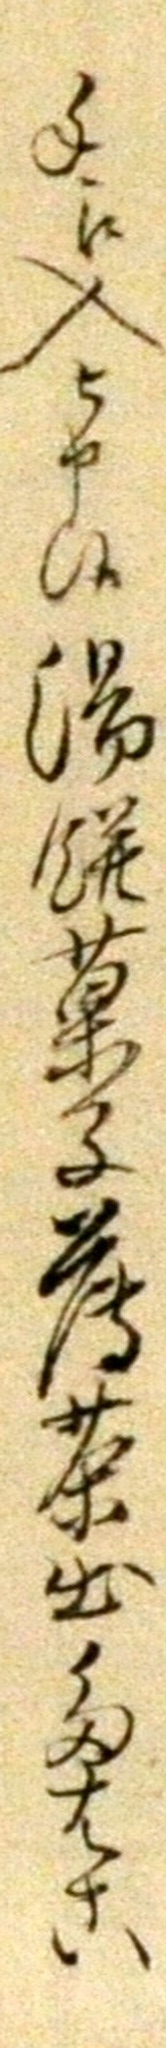手え入被申候湯餅菓子薄茶出たはこ
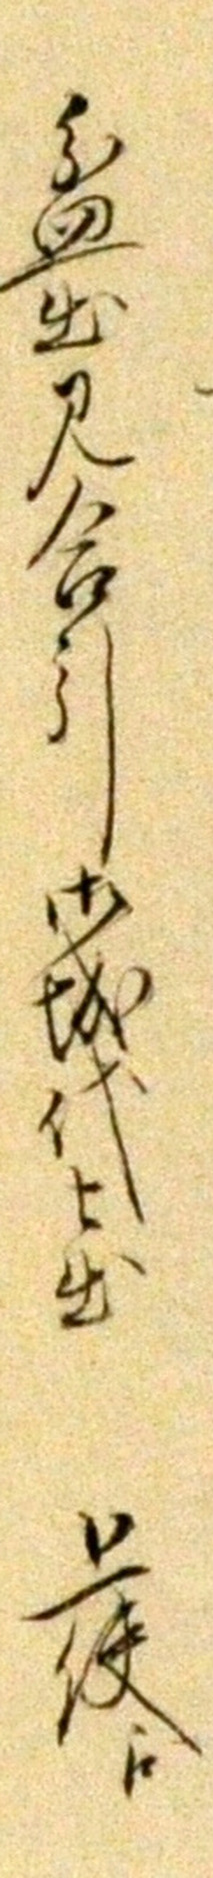盆出見合引御城代被出上使え
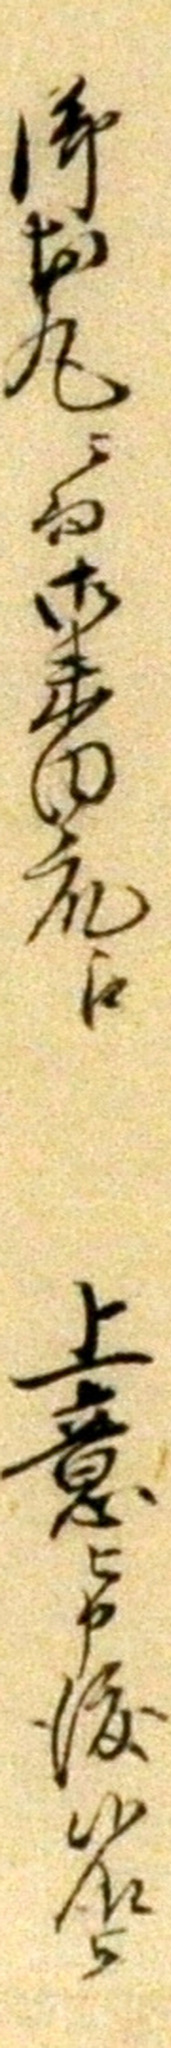御本丸ニ而御番衆え上意被申渡候様被
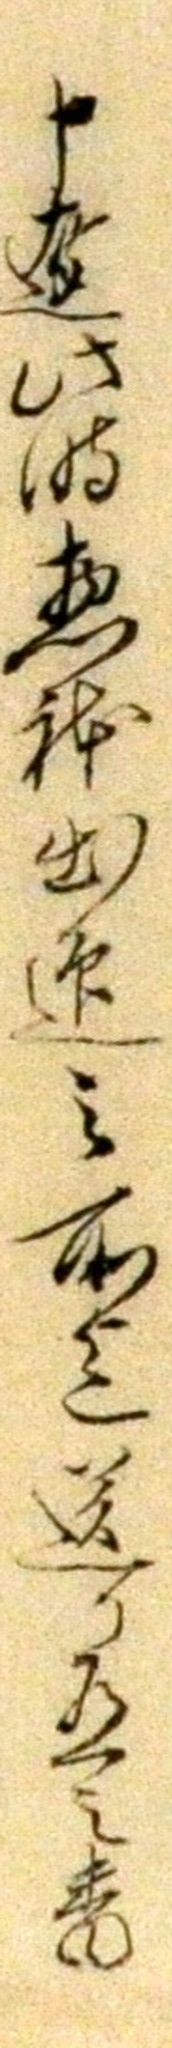申達此時惣躰出迎之所迄送り有之番
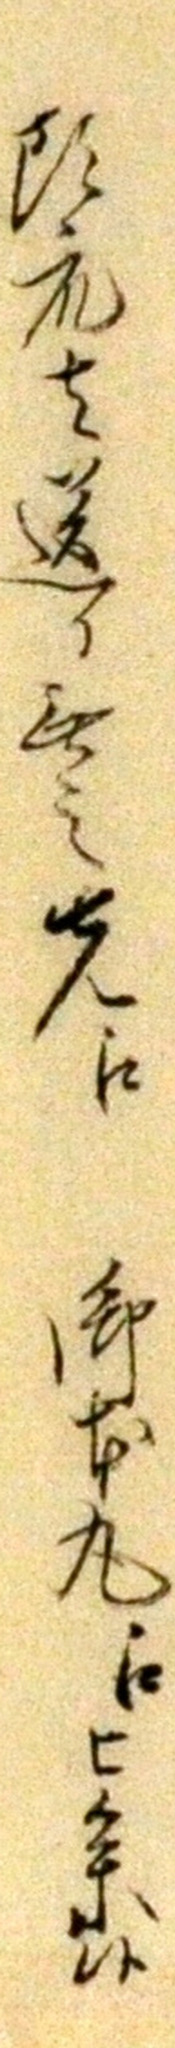頭衆は送り無之先え御本丸え被参候
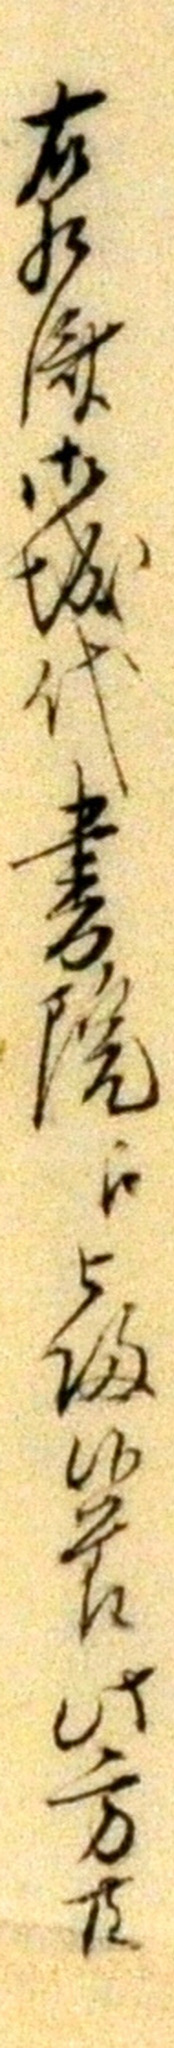右相済御城代書院え被帰候節此方共
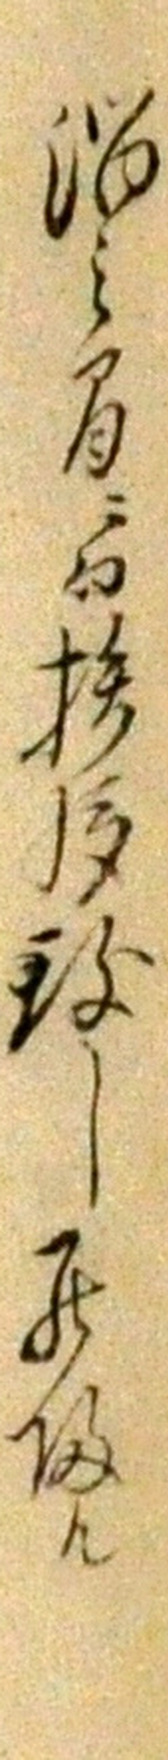溜之間ニ而挨拶致し罷帰ル
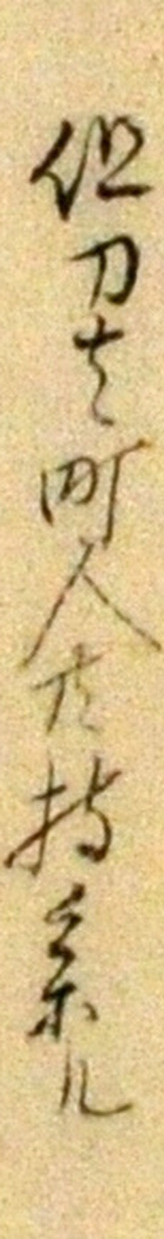但刀は町人共持参ル
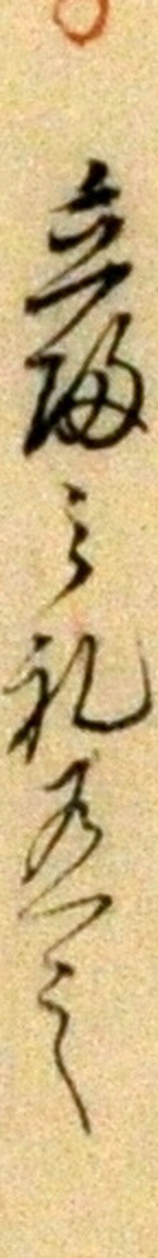立帰之礼有之
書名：大阪加番関係諸書留〔一括〕
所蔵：伊那市立高遠町図書館・合同会社AMANE
